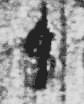十
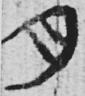月
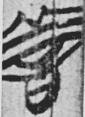善
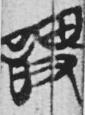諀（譬）
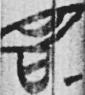言
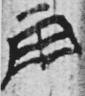雨
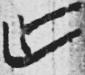亡（無）
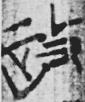政（正）
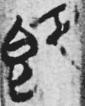即（節）
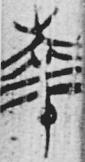南
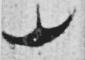山
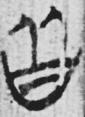皆
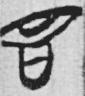言
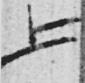上
